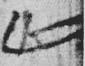亡
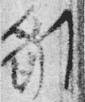咎
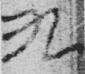九
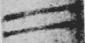二
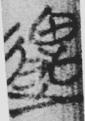遇
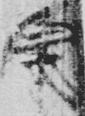○（主）
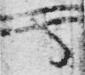于
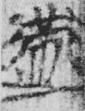○（巷）
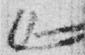亡
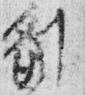咎
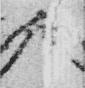六
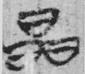晶
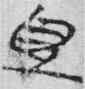見
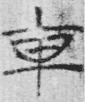車
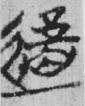遏
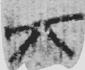亓（其）
